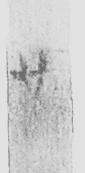廿
